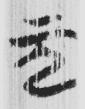元
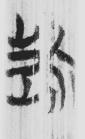折
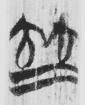並
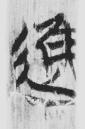進
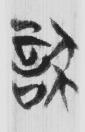{言䖵}
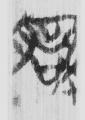䌛
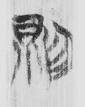則
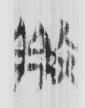{并攴}
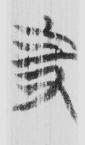寺
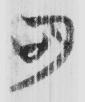名
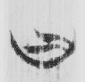曰
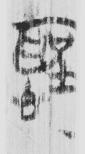{耳呈心}
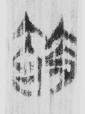昔
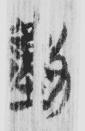勤
